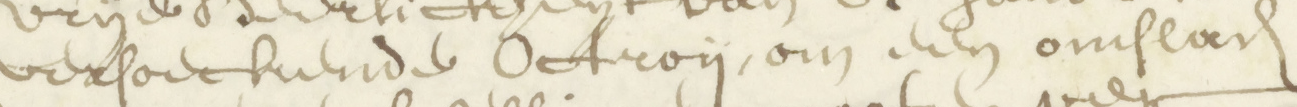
versoeckende octroij, om een omslach
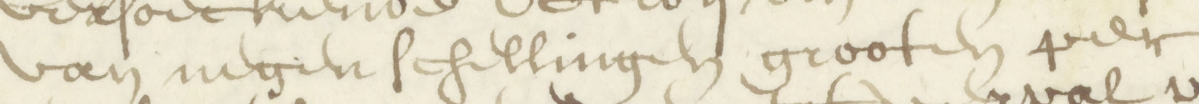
van negen schellingen grooten per
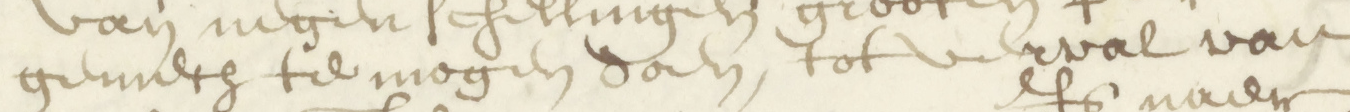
gemeth te mogen doen, tot verval van
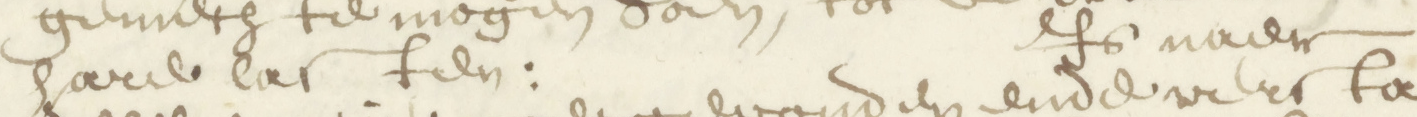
hare lasten: Is naer
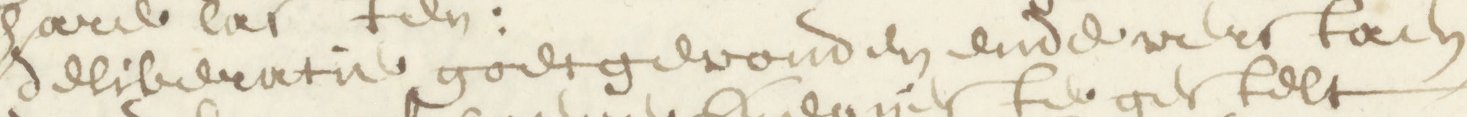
deliberatie goetgevonden ende verstaen
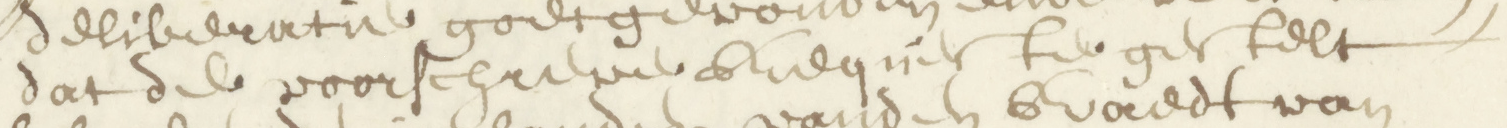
dat de voorschreve requeste gestelt
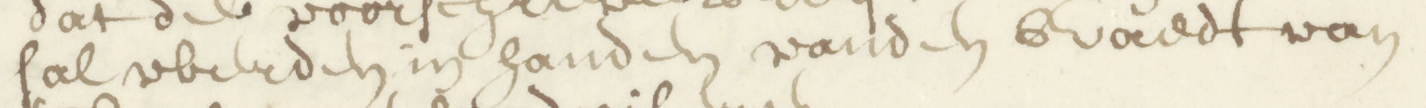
sal werden in handen vanden Raedt van
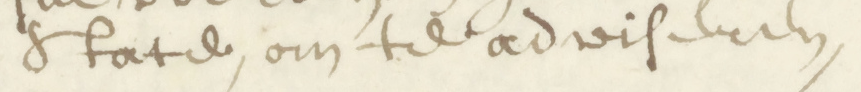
State, om te adviseren.
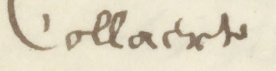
Collaert
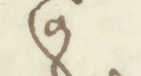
ca
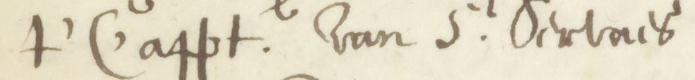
t' Capptl. van St. Servaes
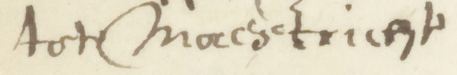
tot Maestricht
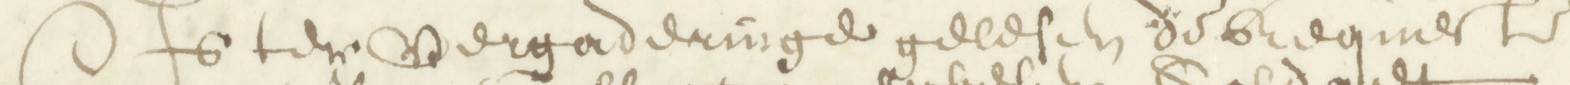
Is ter vergaderinge gelesen de Requeste
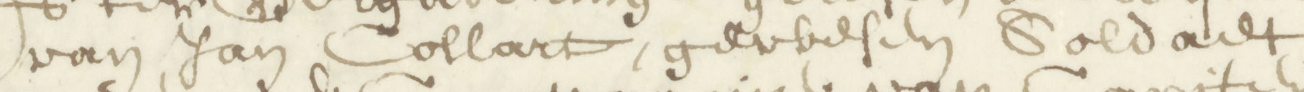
van Jan Collart, gewesen Soldaet
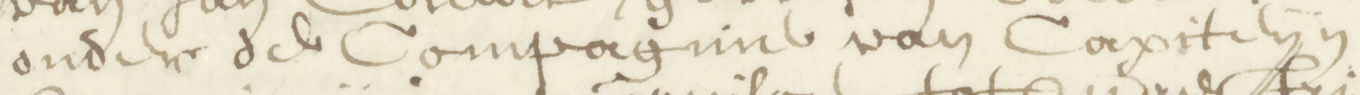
onder de Compagnie van Capiteijn
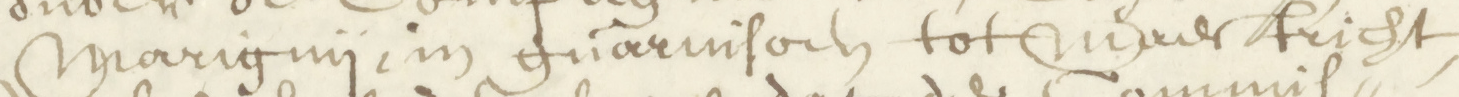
Mariguij, in guarnisoen tot Maestricht
